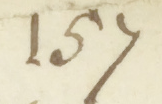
157
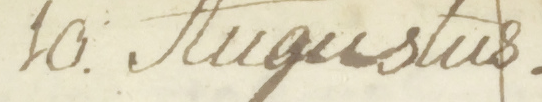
10. Augustus
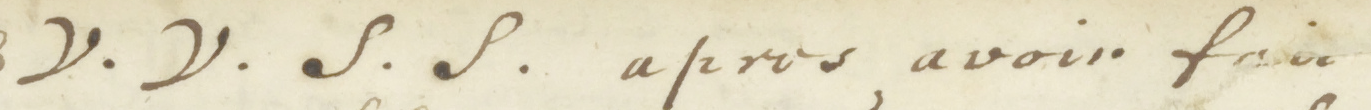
V. V. S. S. apres avoir fait
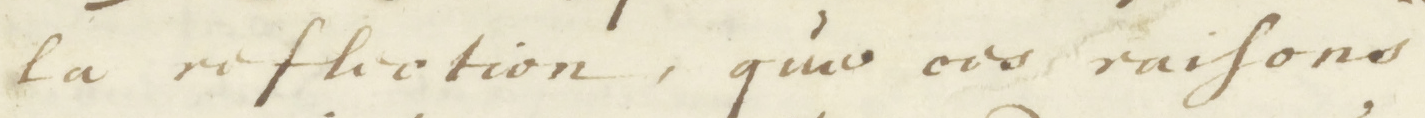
la reflection, que ces raisons
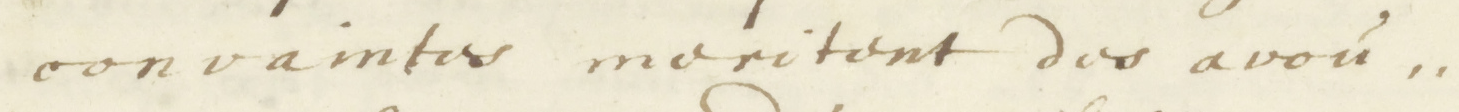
convaintes meritent des avou„
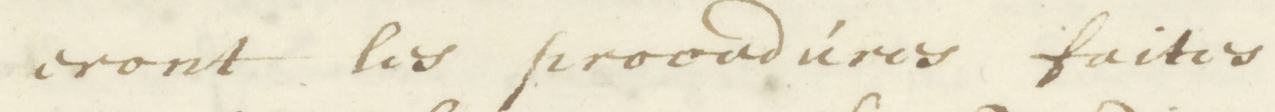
eront les procedures faites
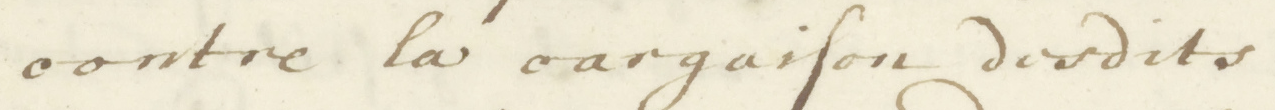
contre la cargaison desdits
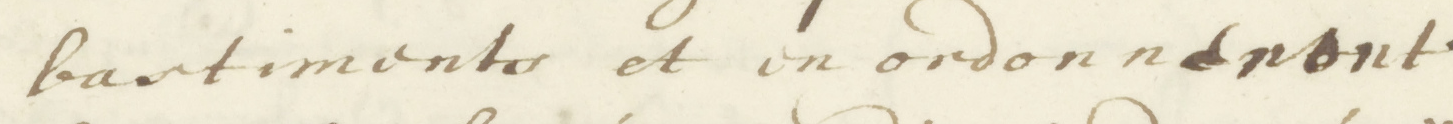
bastiments et en ordonneront
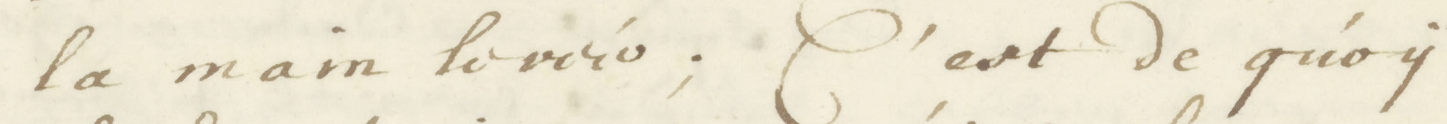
la main levée; C‛est de quoij
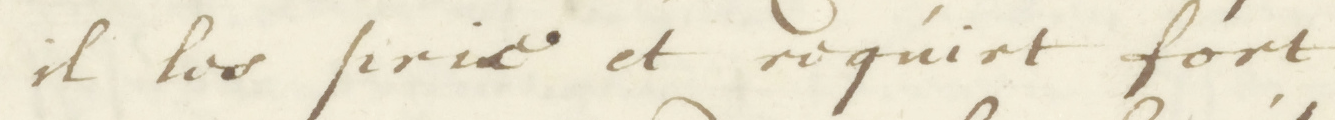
il les prie et requirt fort
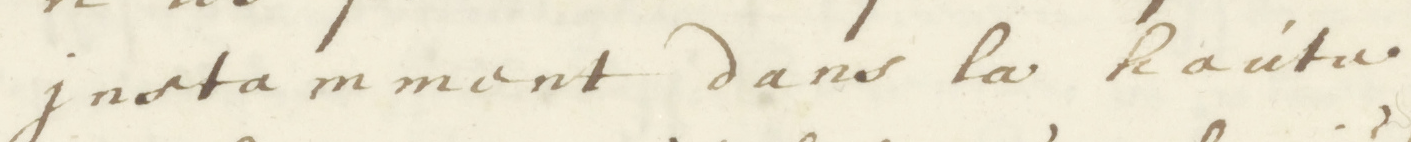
instamment dans la haute
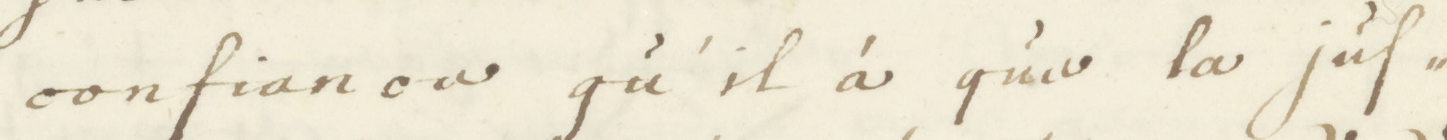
confiance qu'il á que la jus„
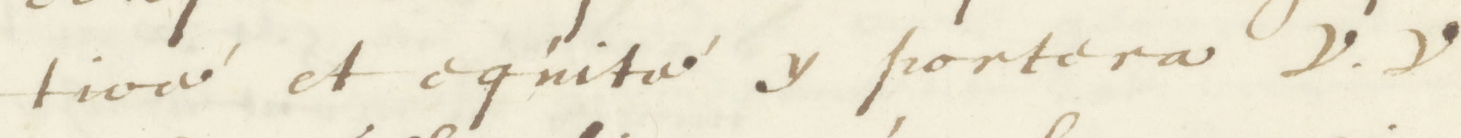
tice et equite y portera V.V.
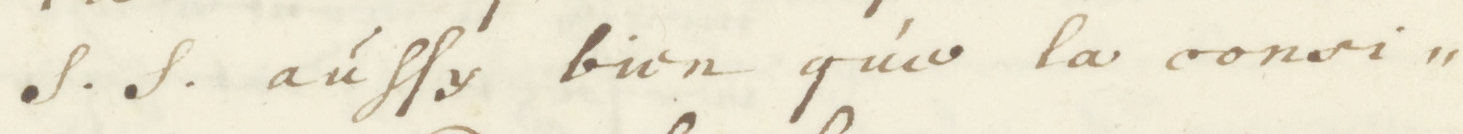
S. S. aussy bien que la consi„
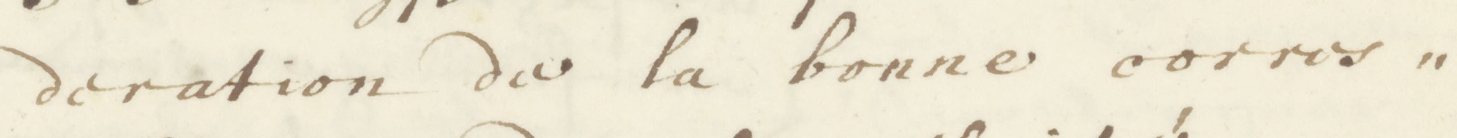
deration de la bonne corres„
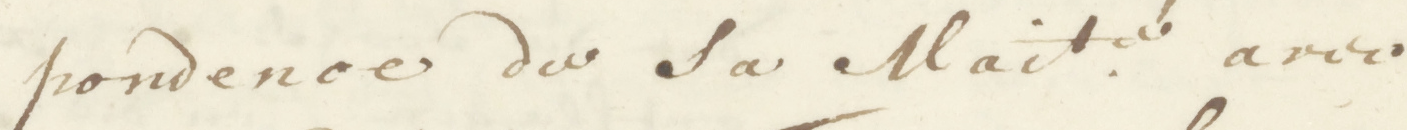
pondence de sa Maité avec
